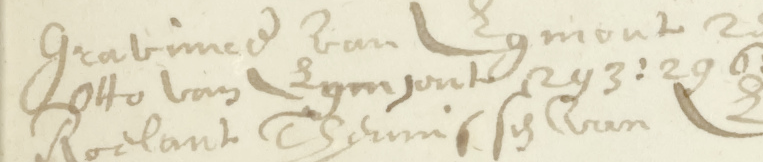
Otto van Egmont 293: 296:
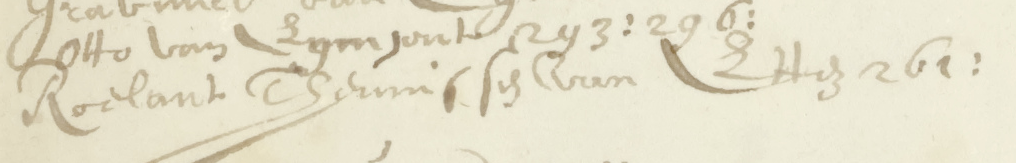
Roelant Theunissen van Etten 261:
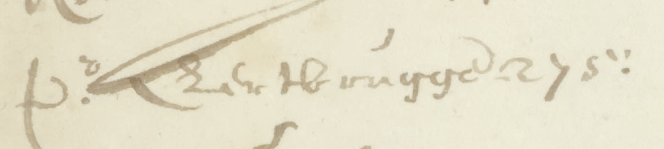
Pr. Eertbrugge 275:
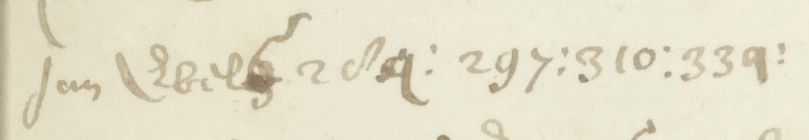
Jan Ebelz 284: 297: 310: 334:
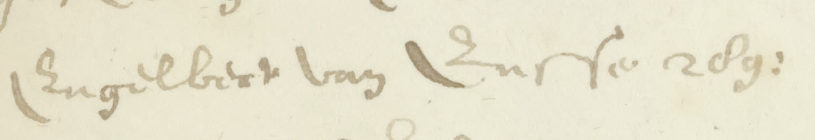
Engelbert van Ensse 289:
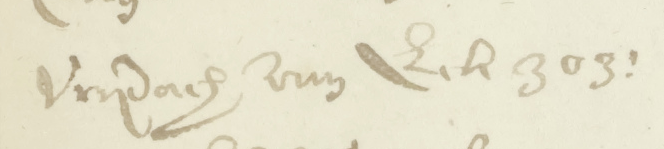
Vrydach van Eck 303:
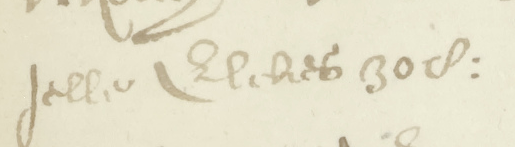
Jelle Elckes 308:
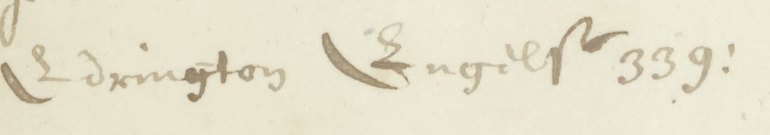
Edrington Engels 339:
